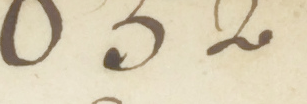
652
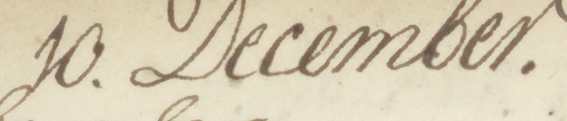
10. December.
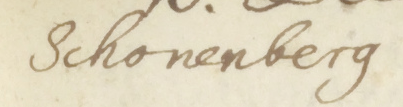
Schonenberg
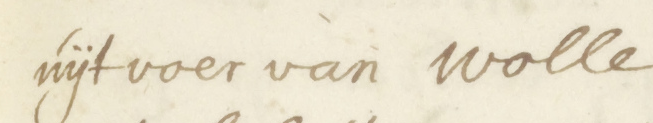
uijtvoer van wolle
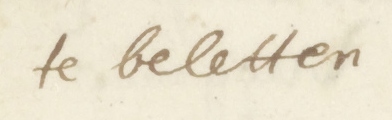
te beletten
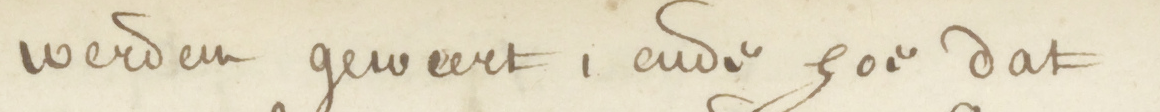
werden geweert, ende hoe dat
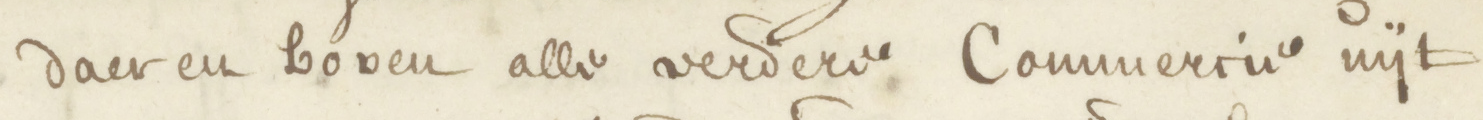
daer en boven alle verdere Commercie uijt
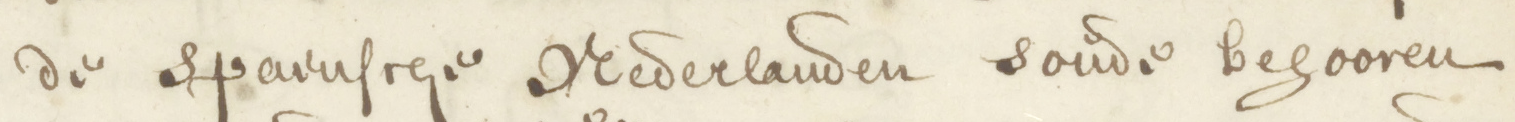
de spaensche Nederlanden soude behooren
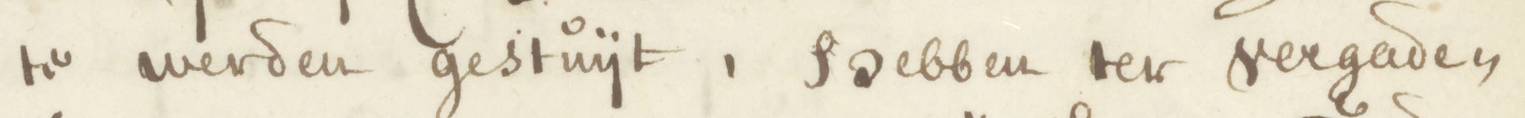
te werden gestuijt, Hebben ter vergade„
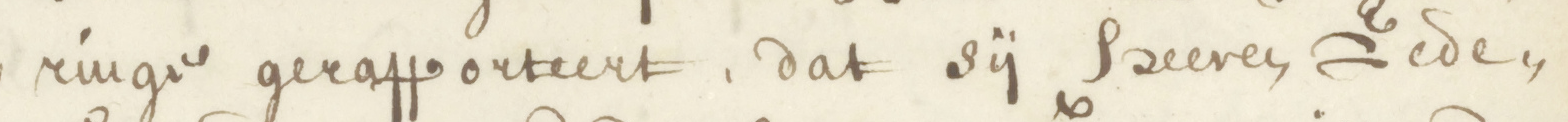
„ringe gerapporteert, dat sij Heeren Gede„
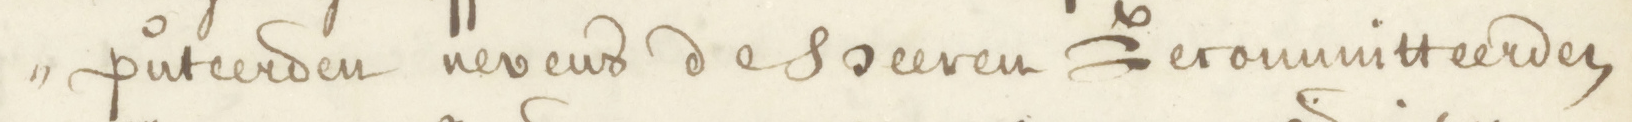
„puteerden nevens de Heeren Gecommitteerden
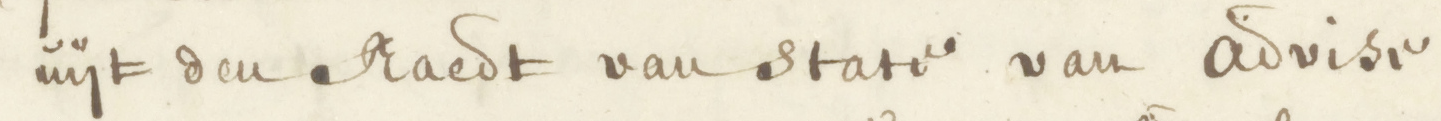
uijt den Raedt van State van advise
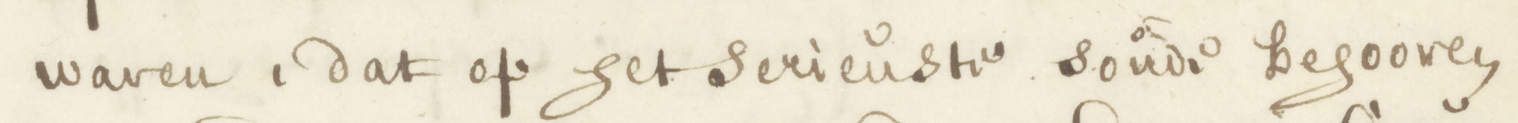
waren, dat op het serieuste soude behooren
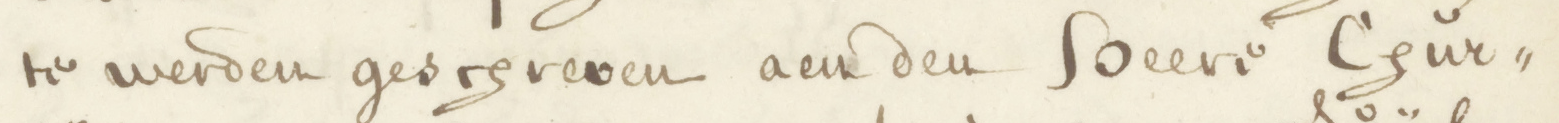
te werden geschreven aen den Heere Chur„
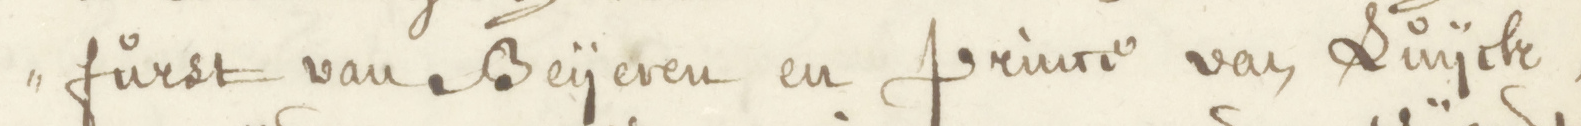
„furst van Beijeren en Prince van Luijck,
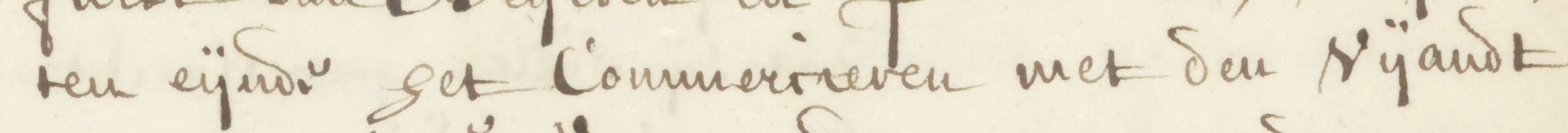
ten eijnde het commercieren met den Vijandt
